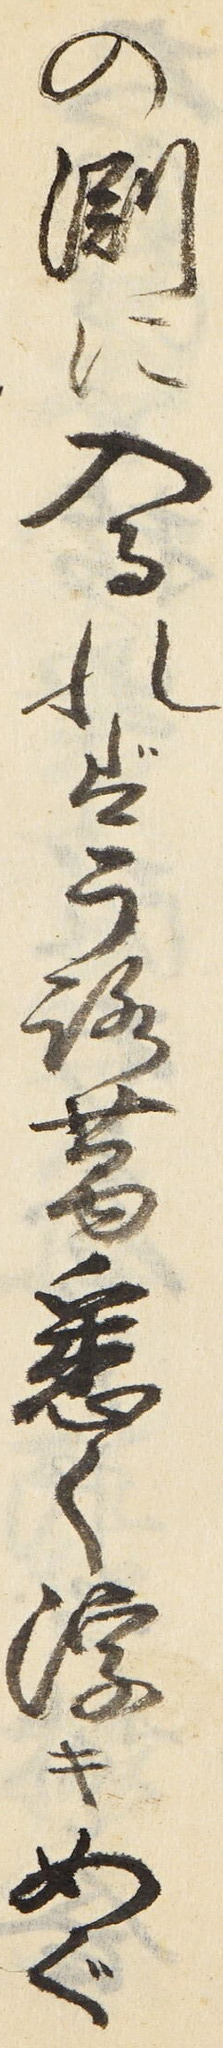の渕に入るればうろ葛悉く浮きめぐ
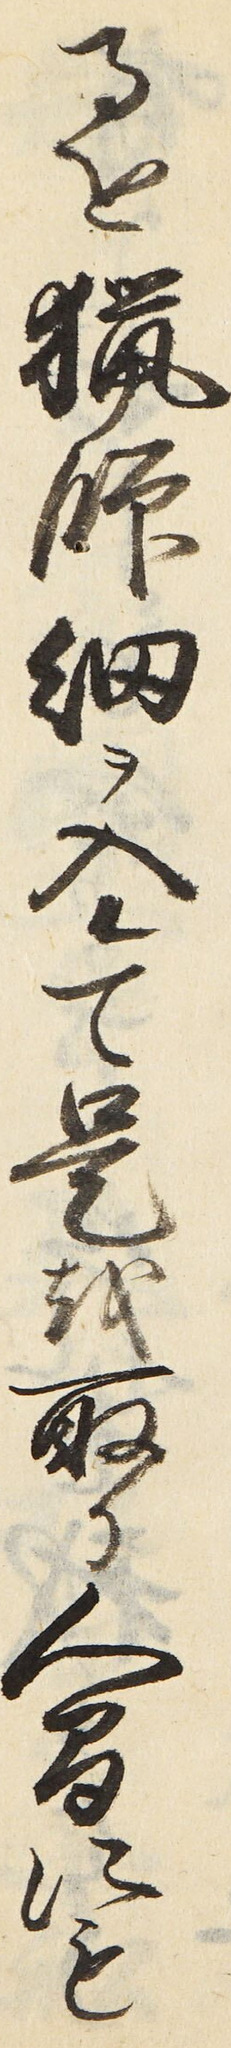るを猟師網を入れて是を取り人間にも
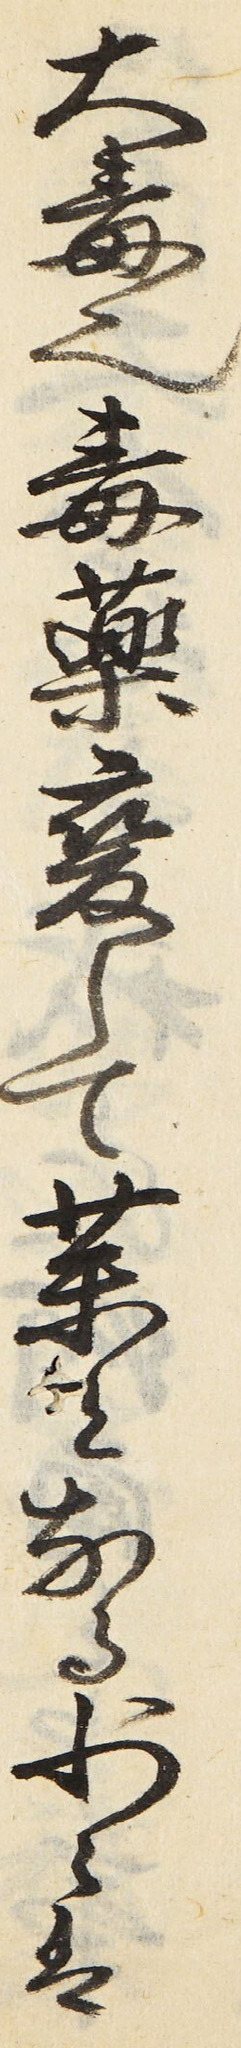大毒也毒薬変して薬となる少々は
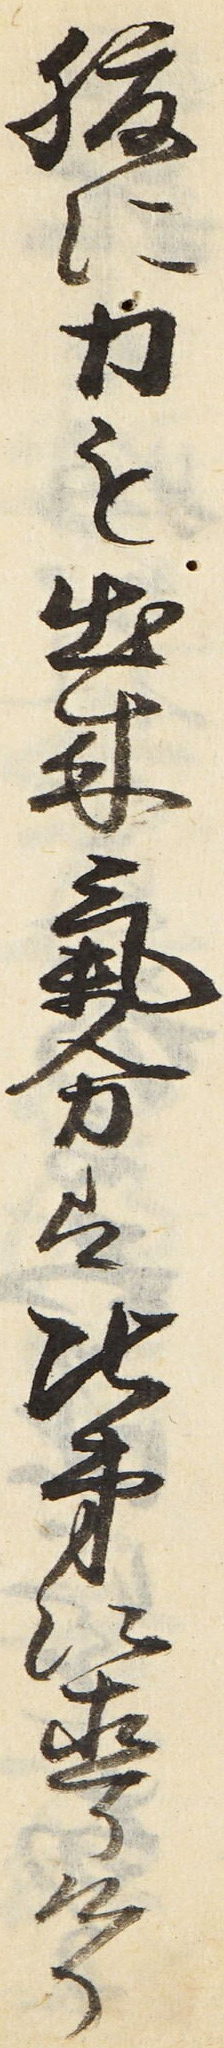腹に力も出来気分は次第に直りけり
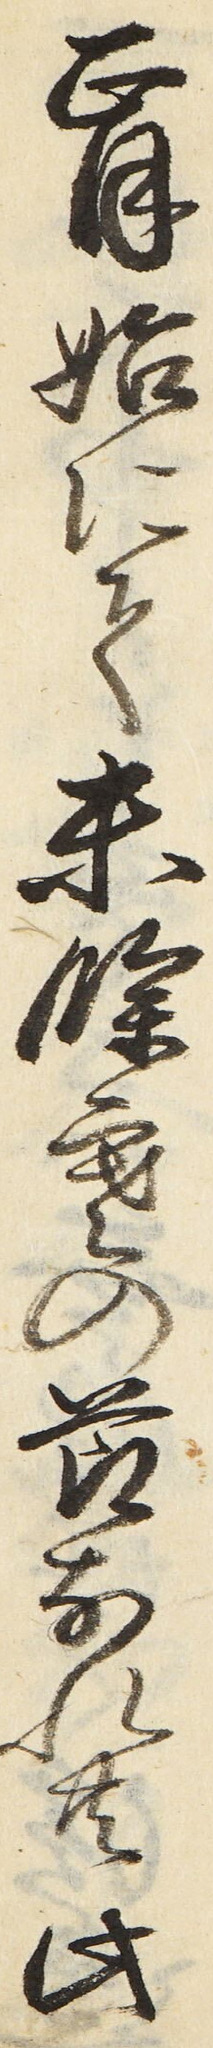正月始にて来余寒の節なれ共此
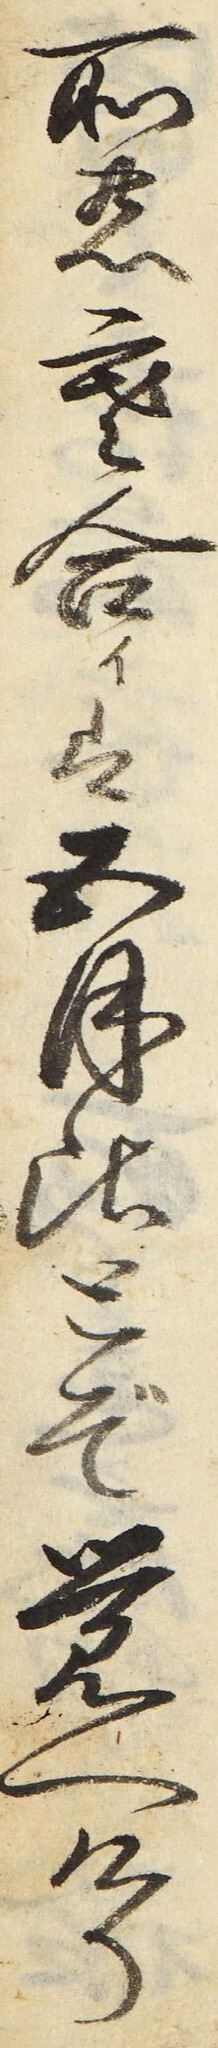所の寒合いは五月頃とぞ覚へけり

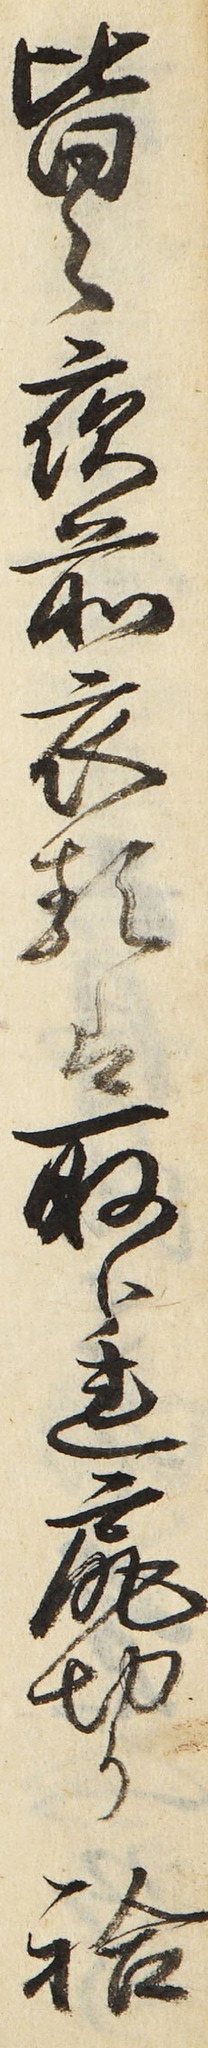皆々夜前衣類は取られ尻切り袷
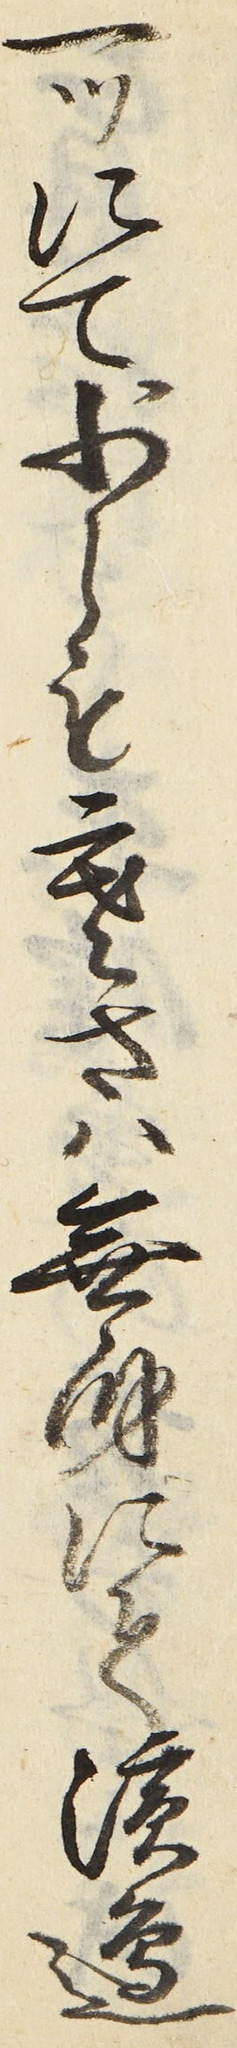一ツにて少しも寒さは無身にて浜辺
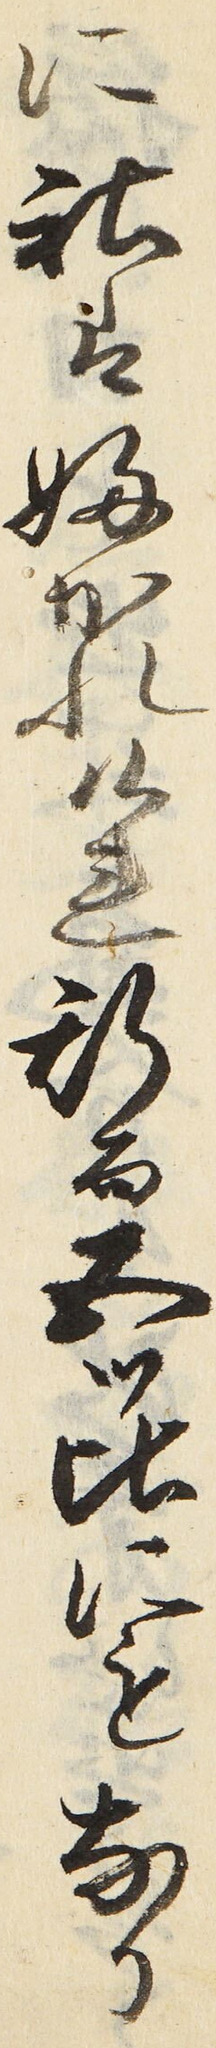にはふかれけれ斯而五ツ頃にもなり
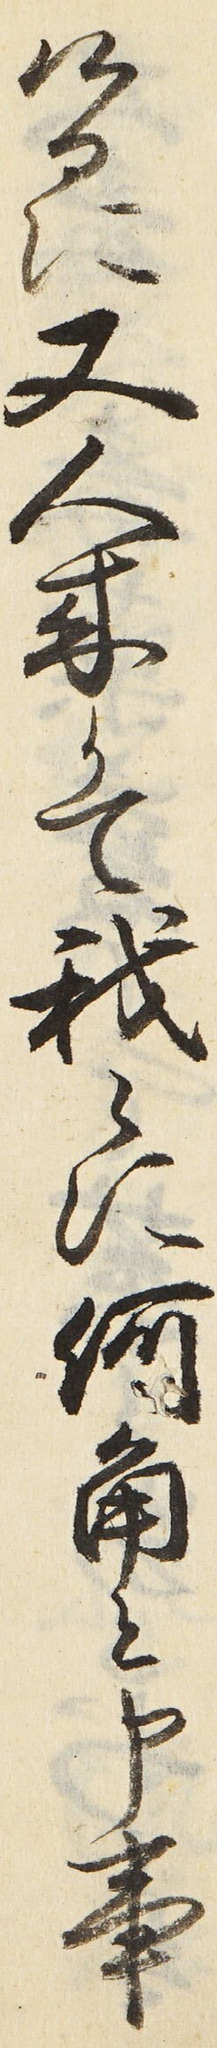けるに又人来りて我々に何角と申事
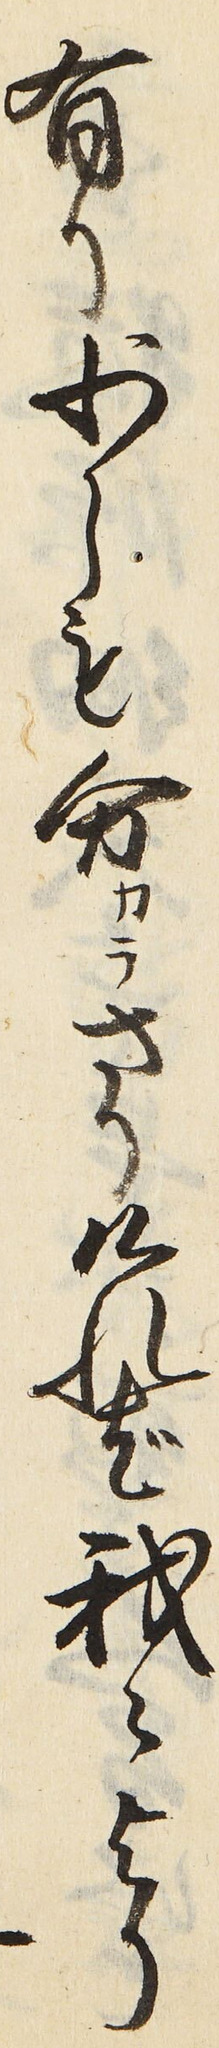有り少しも分からさりければ我々より
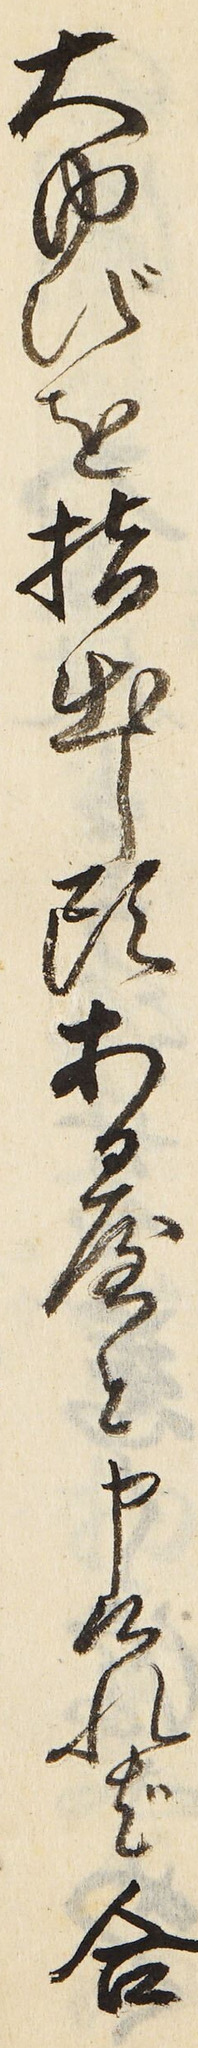大ゆびを指出し頭あるやと申ければ合
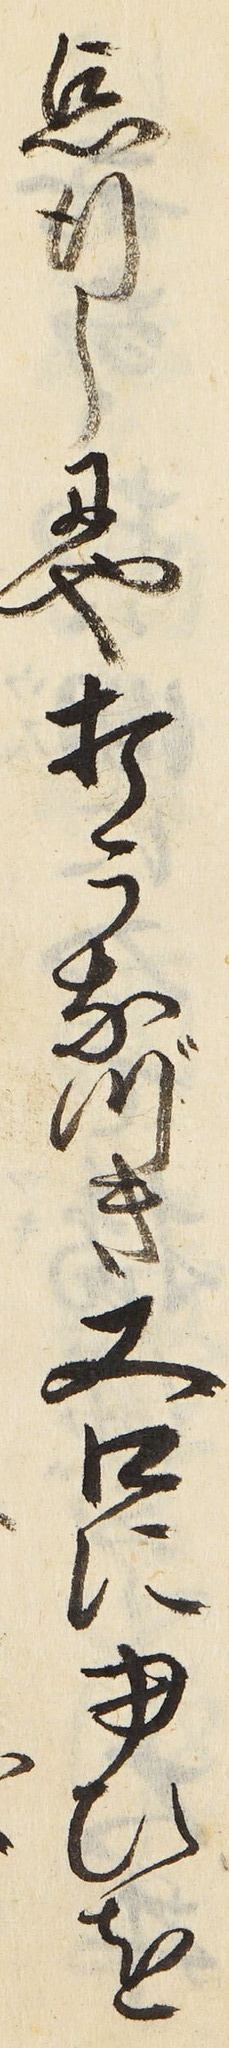点行しにや打うなづき又口にゆひを
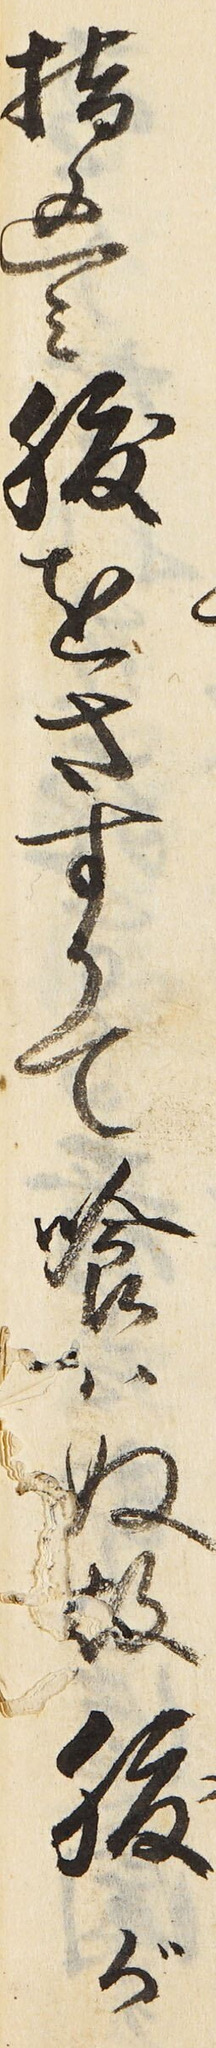指込み腹をさすりて喰はぬ故腹が
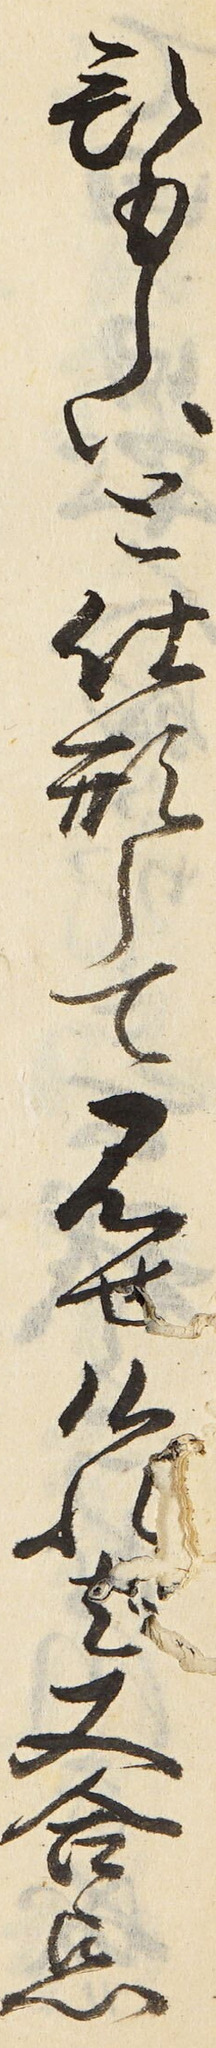ひもしいと仕形して見せければ又合点
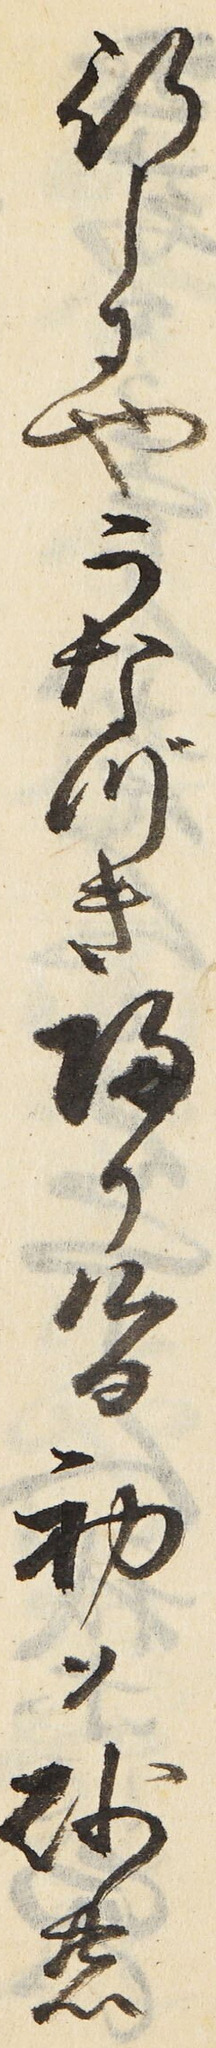行しにやうなづき帰りける初め砂の
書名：華夷九年録
